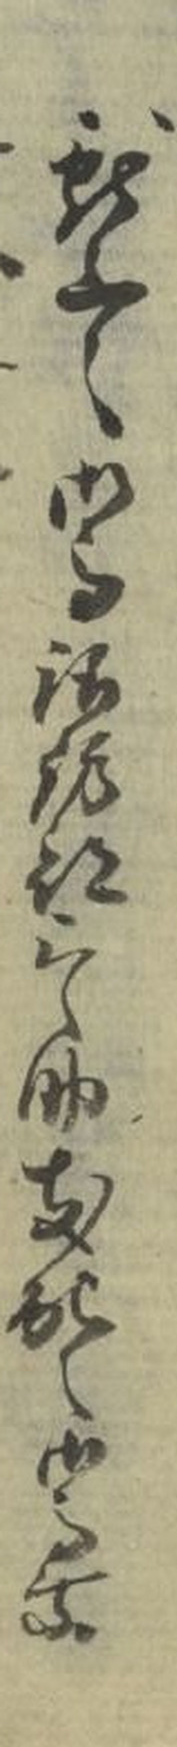献上之御馬諏訪部三之助支配之御馬乗
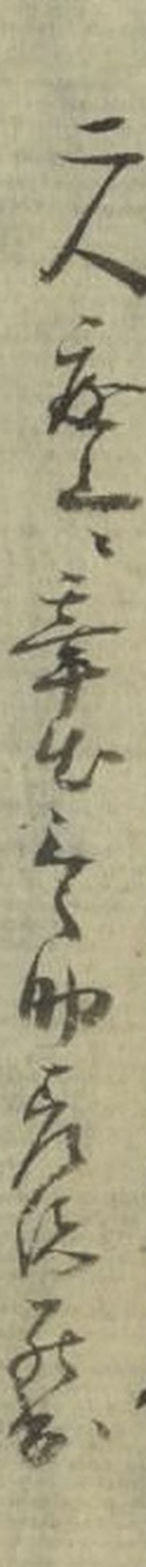二人庭上に牽出三之助差添罷出
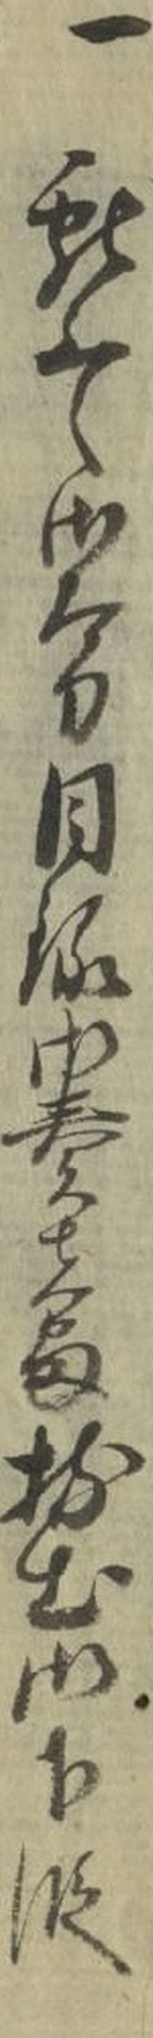一献上之御太刀目録御奏者番持出御下段
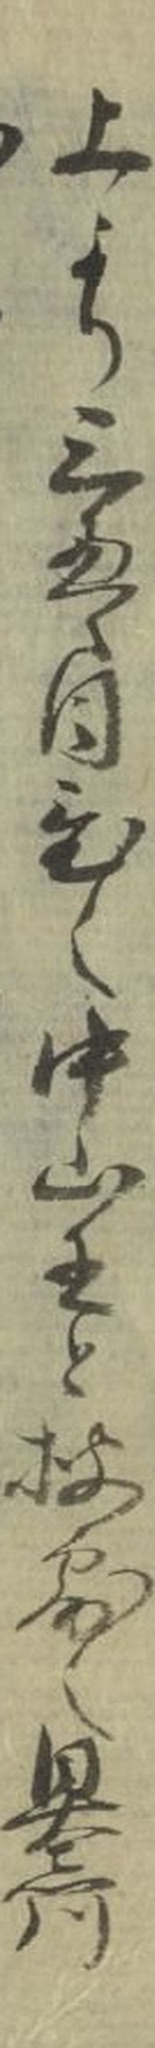上より三畳目置之中山王と披露之具志川
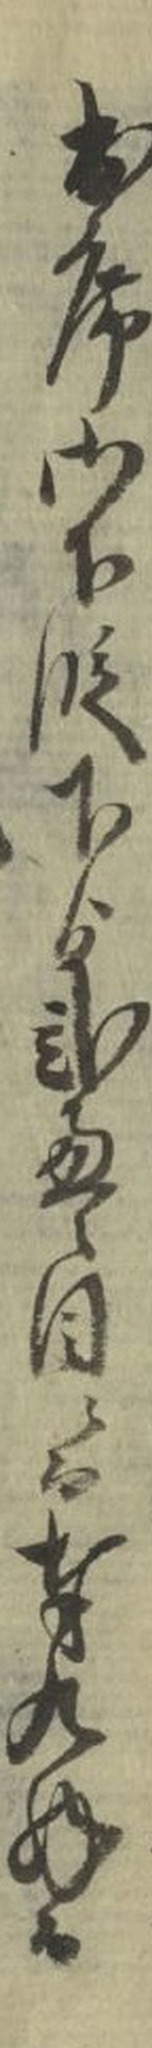出席御下段下ゟ弐畳目にて奉九拝而
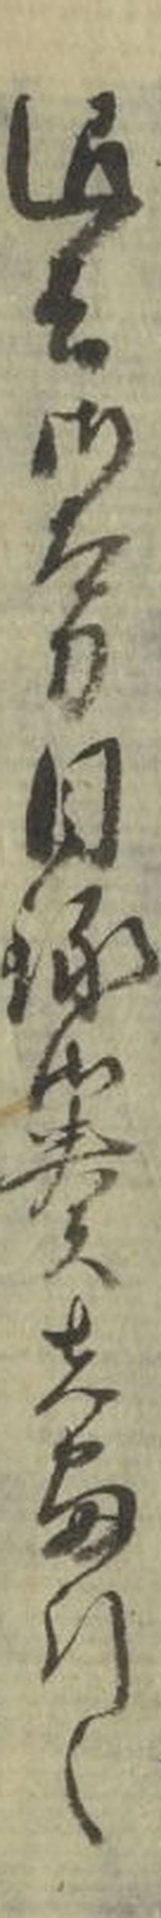退去御太刀目録御奏者番引之
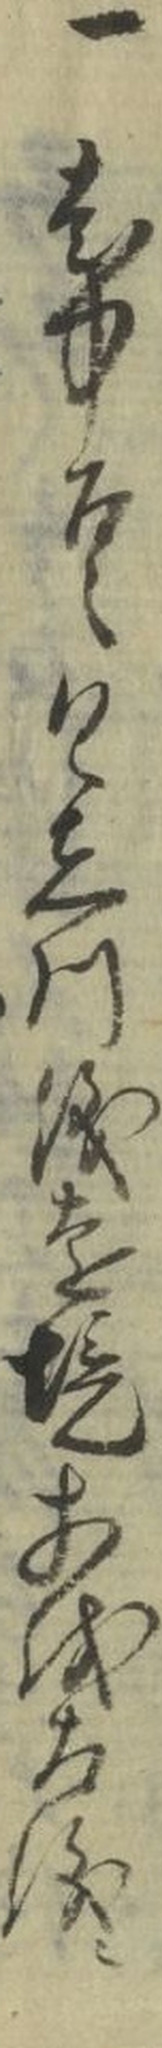一老中召之具志川儀遠境相越太儀に
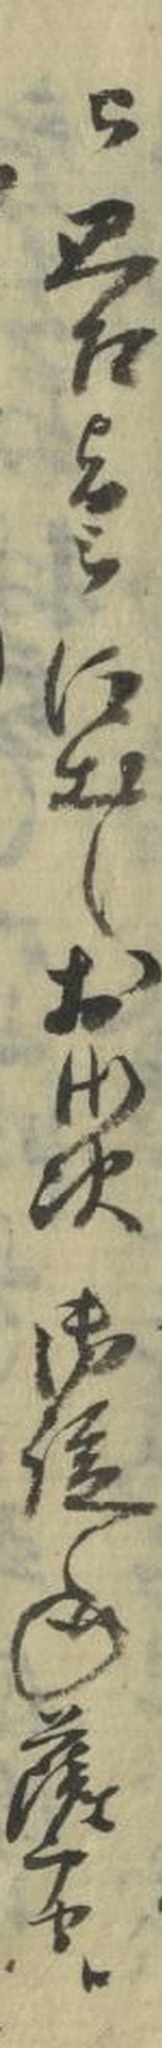被思召旨被仰出之於御次御諚之趣薩摩守え
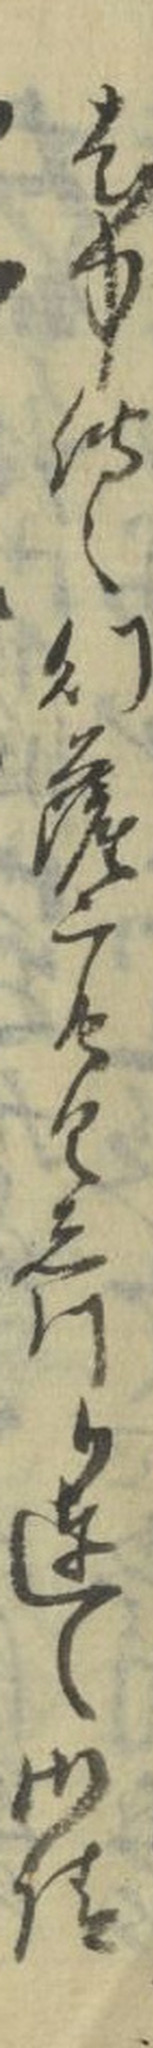老中伝之則薩摩守具志川え達之御請
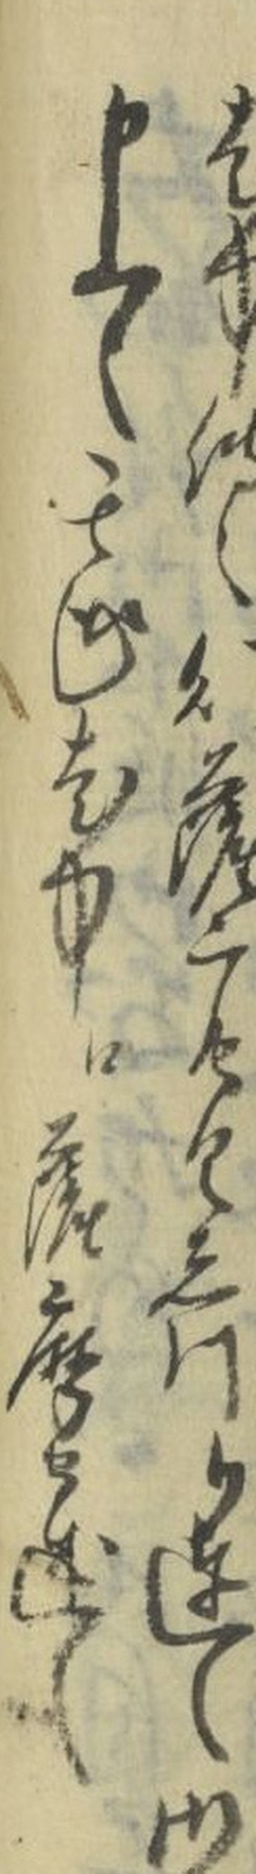申上之其趣老中え薩摩守述之
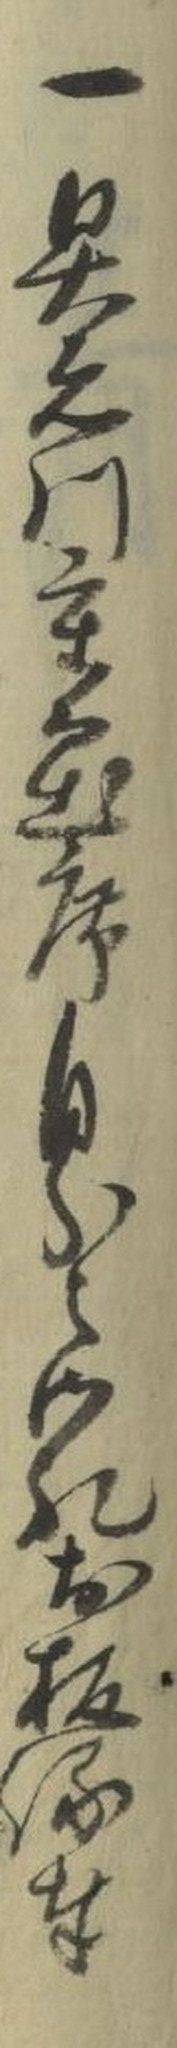一具志川重て出席自分之御礼於板縁奉
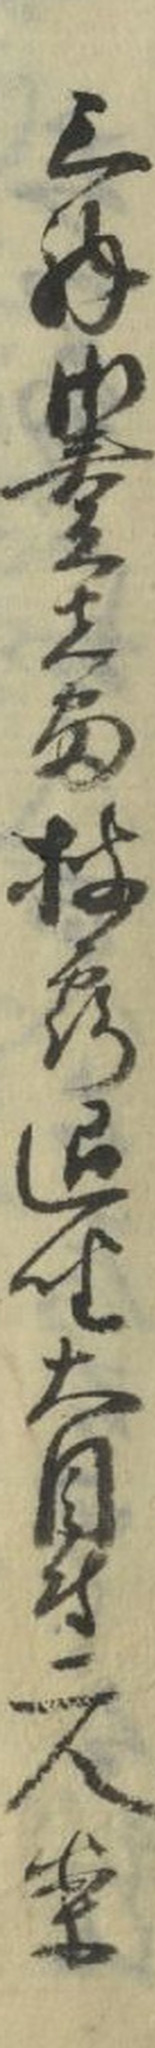三拝御奏者番披露退座大目付二人案
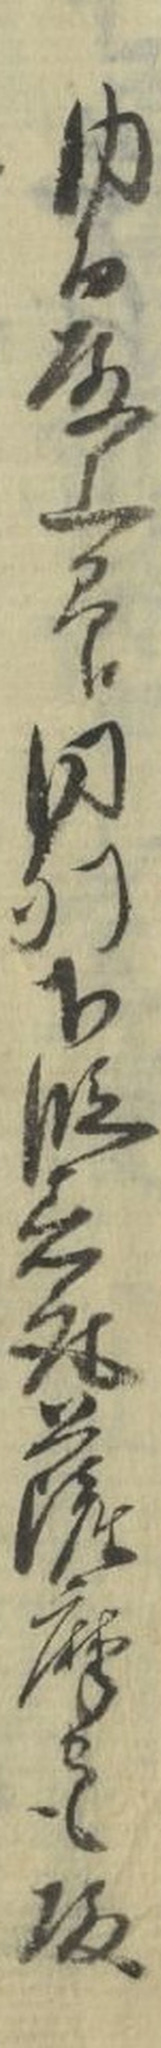内而殿上間え同列下段着座薩摩守も殿
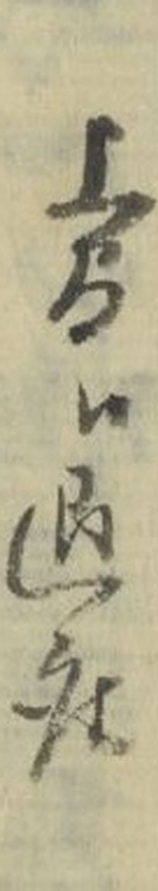上間え退座
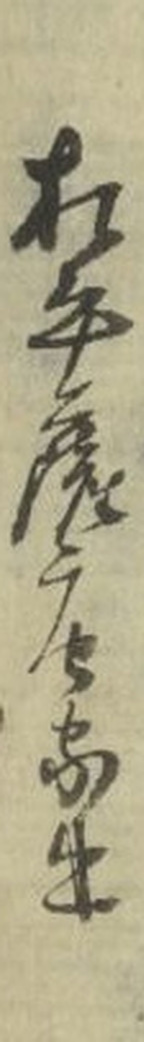松平薩摩守家来
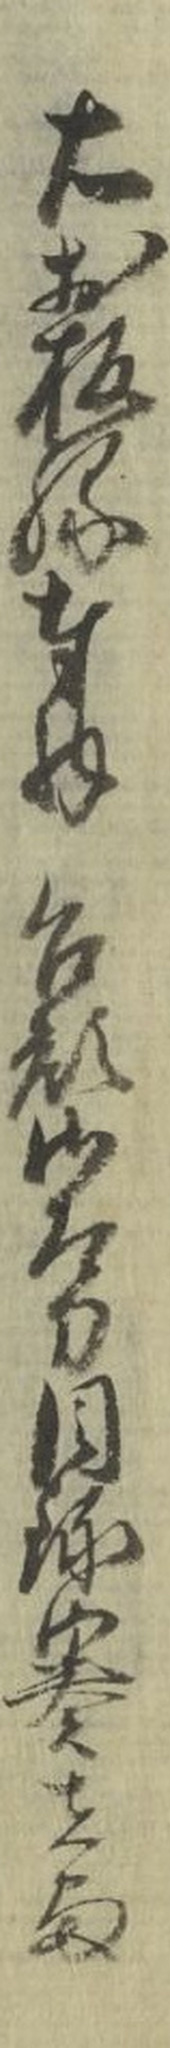右於板縁奉拝台顔御太刀目録奏者番
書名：戊辰琉球人来朝之式 全
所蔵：University of the Ryukyus Library
